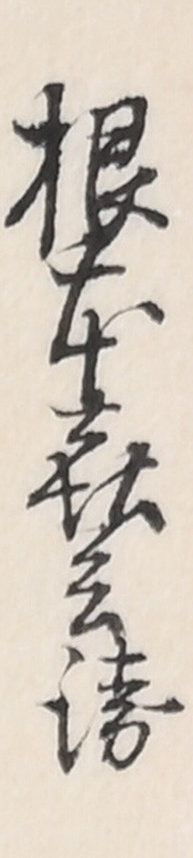根本喜兵衛
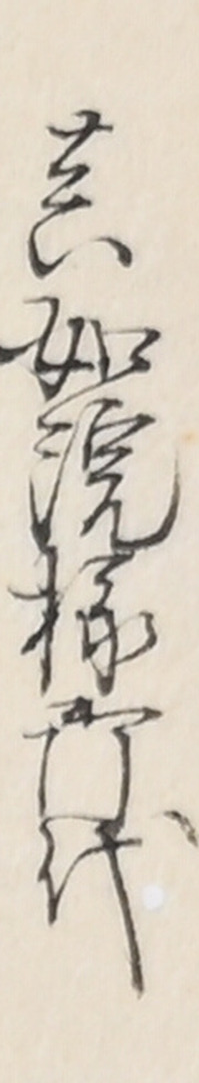真如院様御代
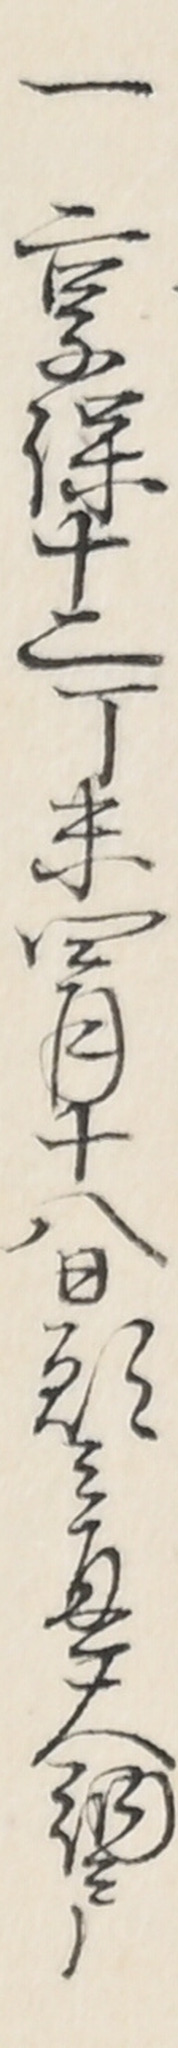一享保十二丁未四月十八日願之通大納戸
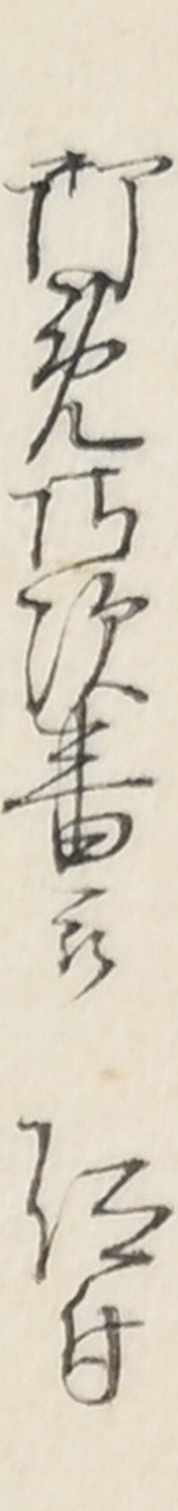御免御次番被仰付
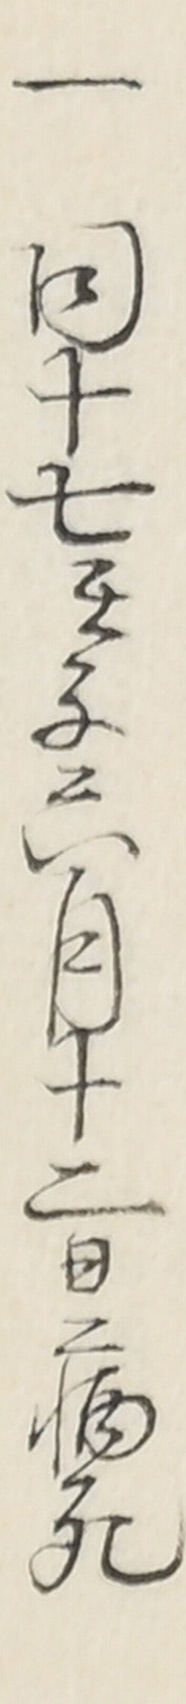一同十七壬子六月十二日病死
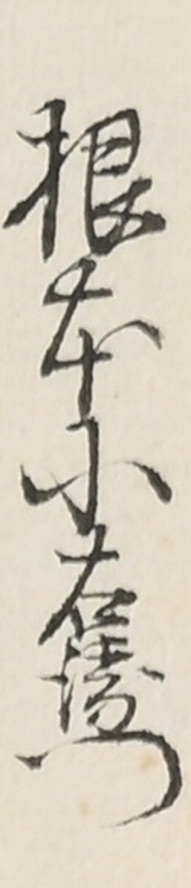根本小右衛門
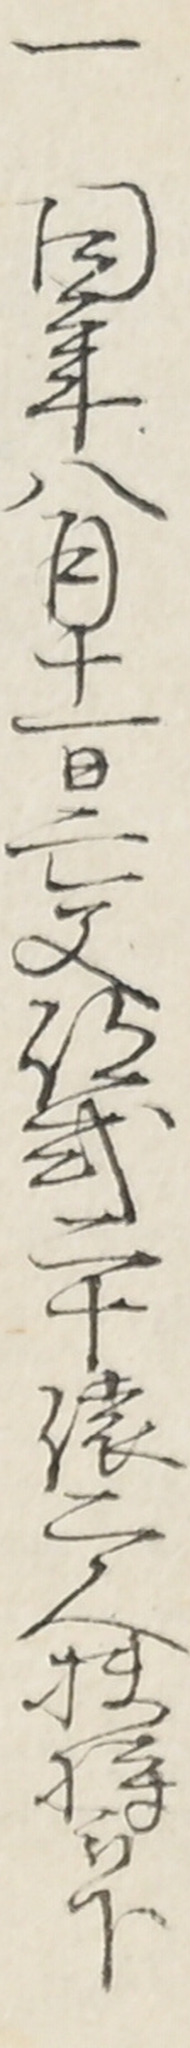一同年八月十一日亡父跡式二十俵二人扶持被下
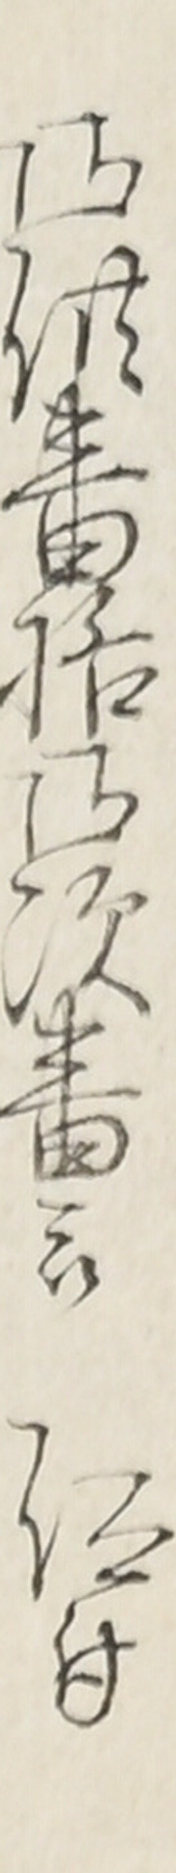御供番格御次被仰付
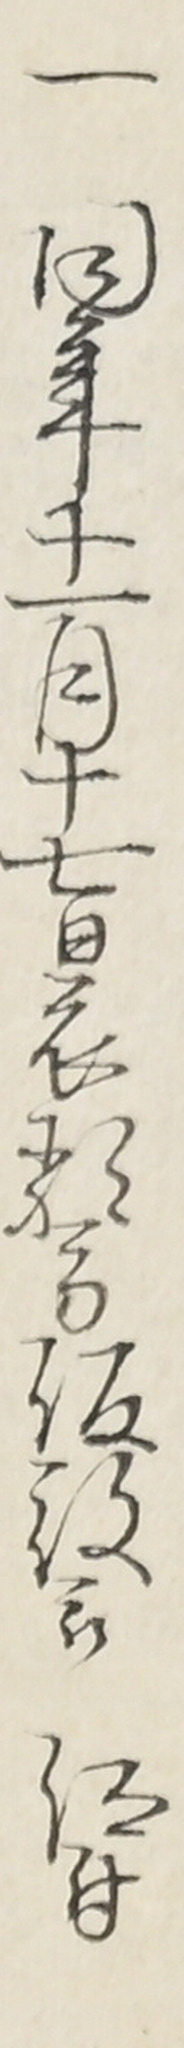一同年十一月十七日衣類方仮役被仰付
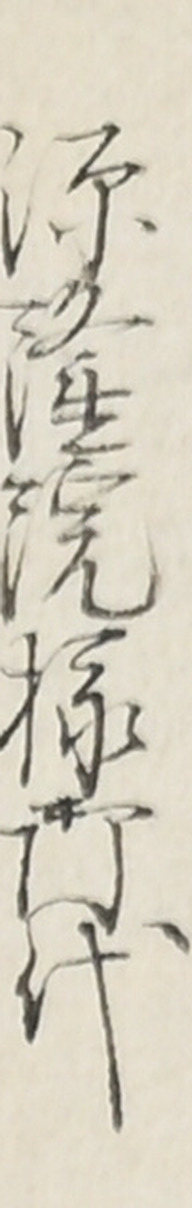源隆院様御代
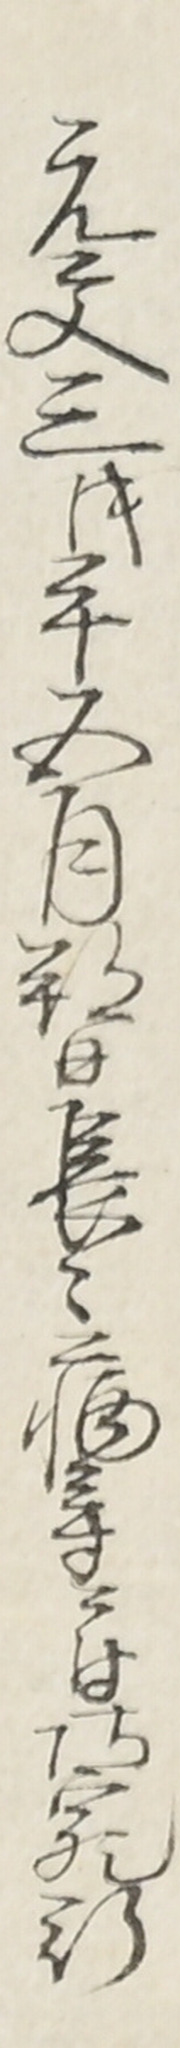一元文三戊午五月朔日長々病気ニ付御宛行
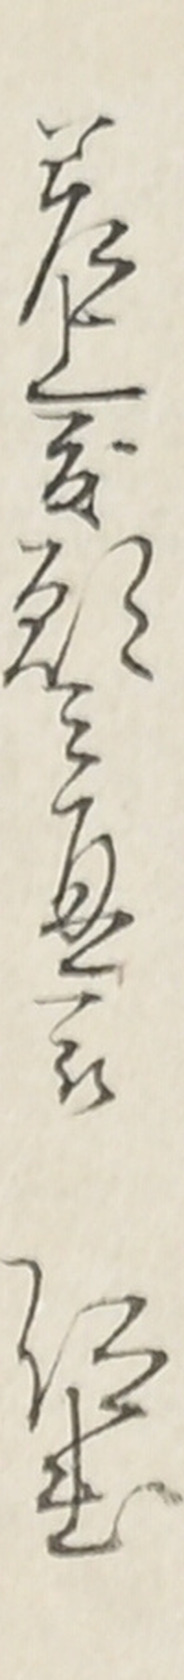差上度願之通被仰出
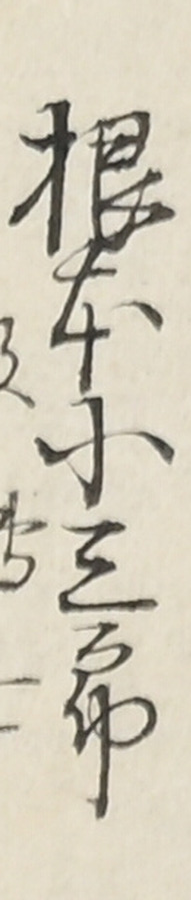根本小三郎

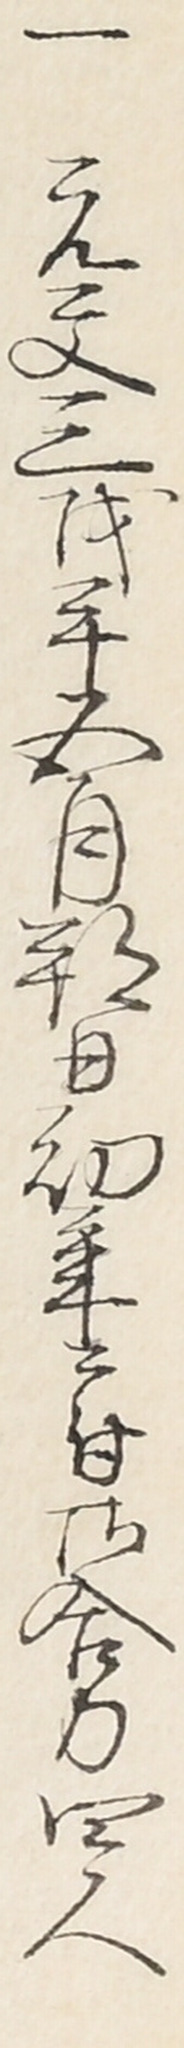一元文三戊午五月朔日幼年ニ付御合力四人
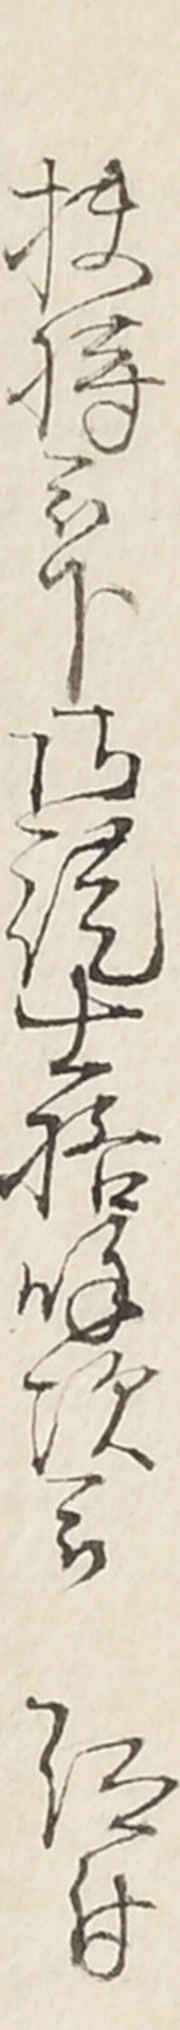扶持被下御徒士格呼次被仰付
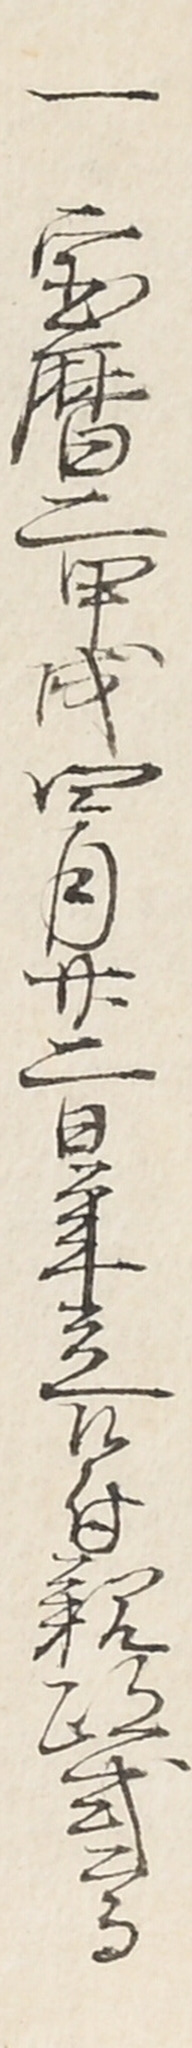一宝暦二甲戌四月廿二日年立候付親跡式高
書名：無足諸士勤仕録（四）
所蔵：伊那市立高遠町図書館・合同会社AMANE
